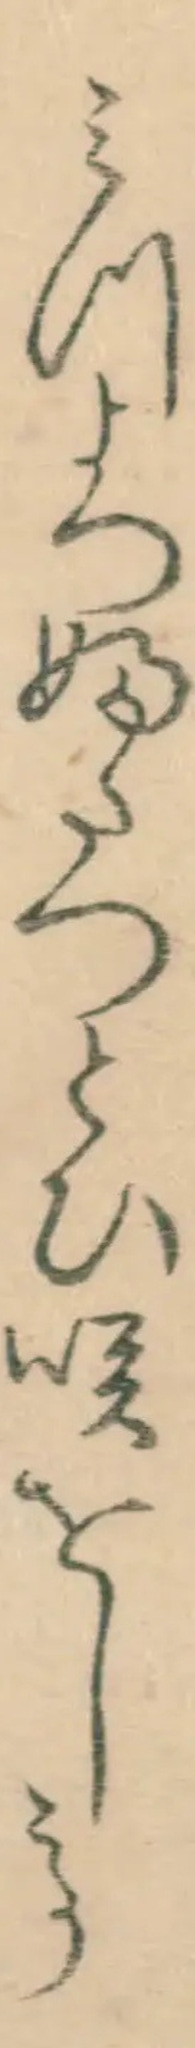ミつよつふたつとひ咲をして
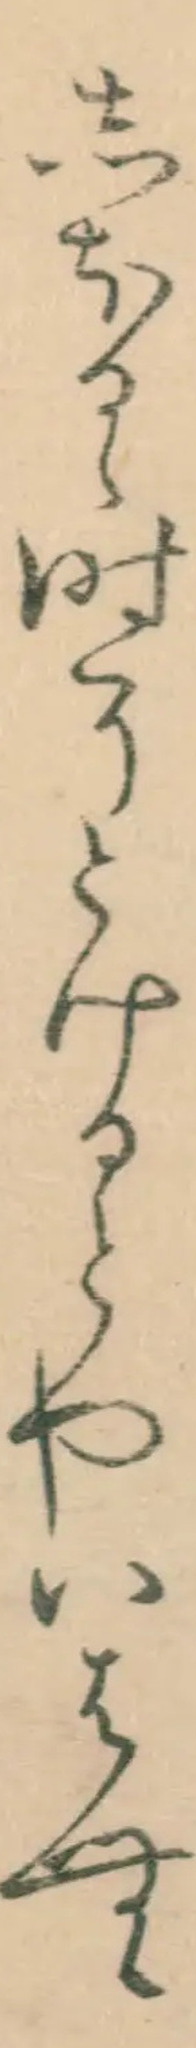しほるゝ時にとけるとやいはむ
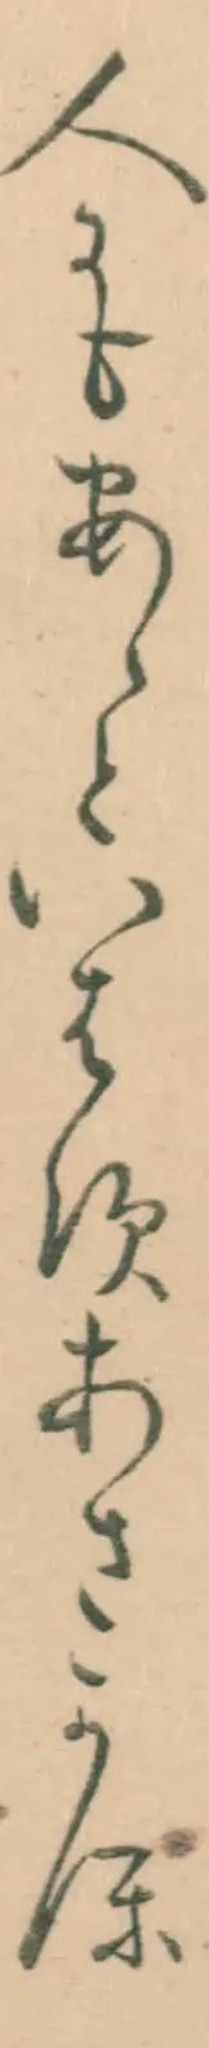人にもあゝといはすあさかほ間戸

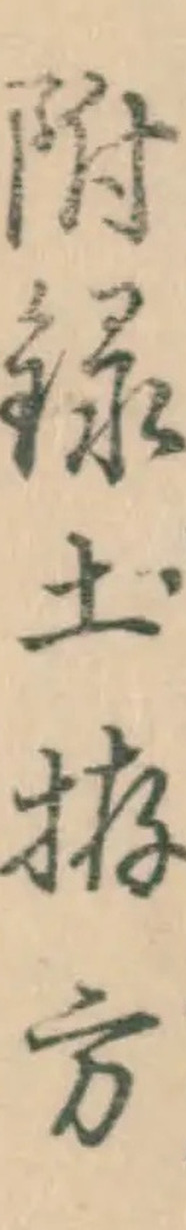附録土拵方
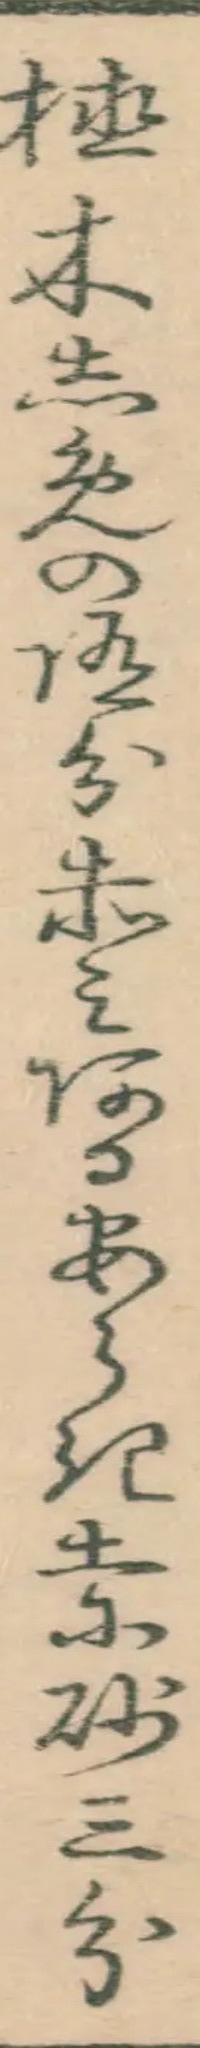植木しめの随分赤ミあるあらき土に砂三分
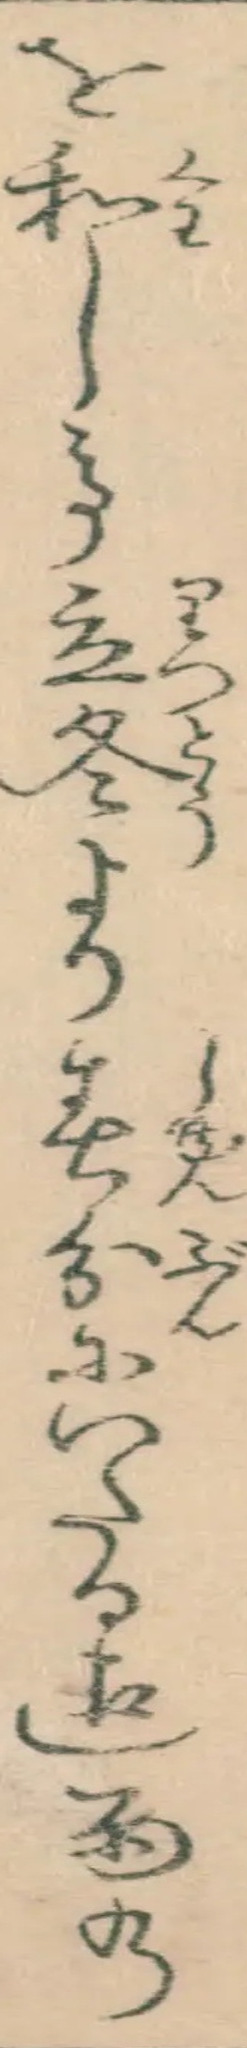を和して立冬より春分にいたる迠雨水
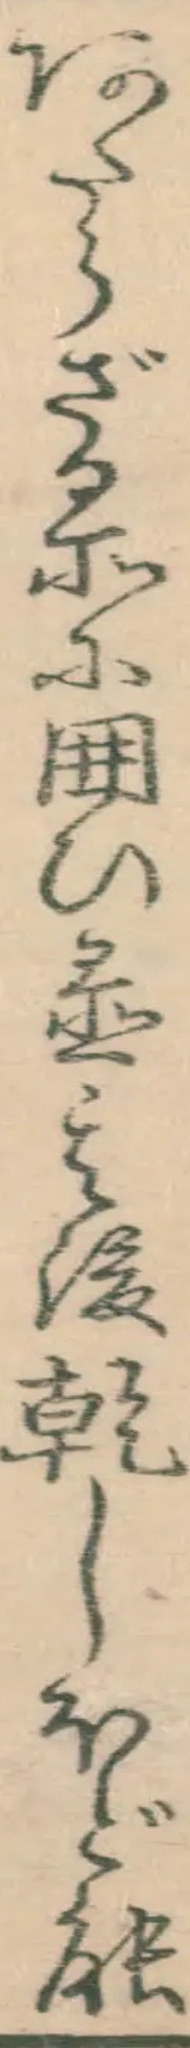あたらざる所に囲ひ置其後乾しほど触
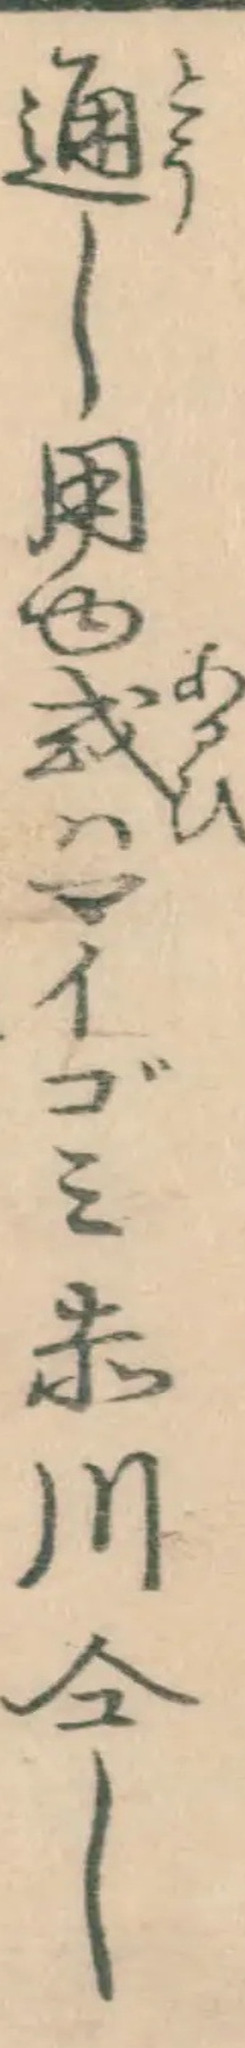遠し用ゆ或ハマイゴミ赤川同し
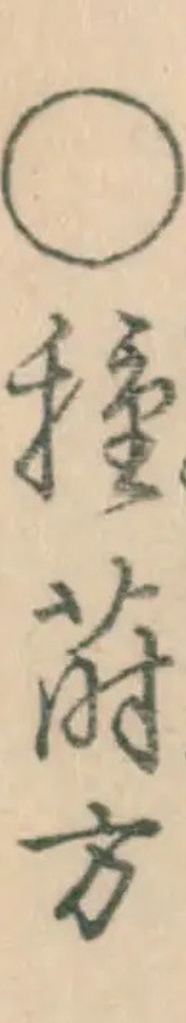〇種蒔方
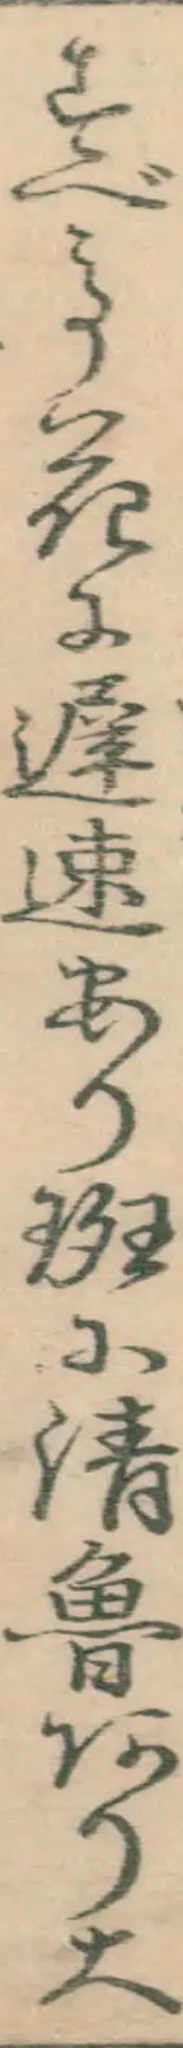すべて花に遅速あり斑に清魯あり大
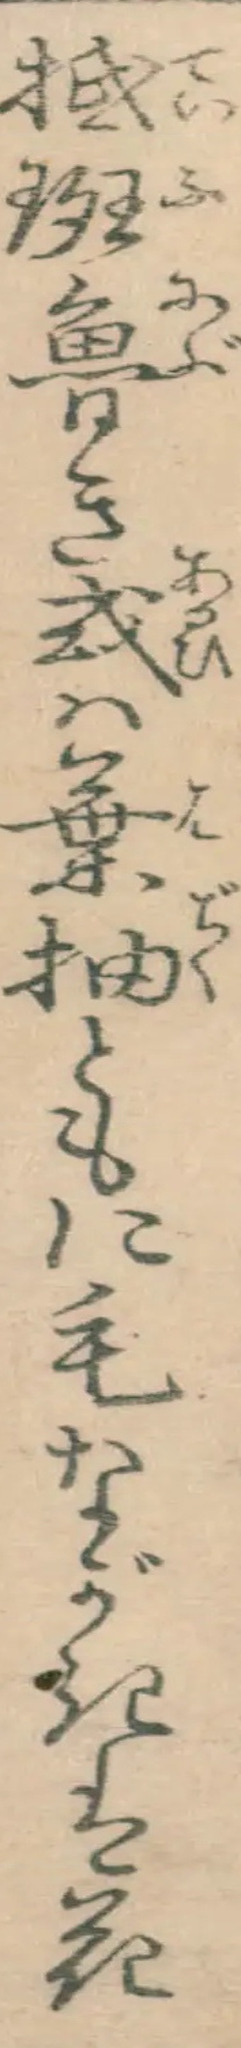抵斑魯き或ハ葉柚ともに毛ながきは花

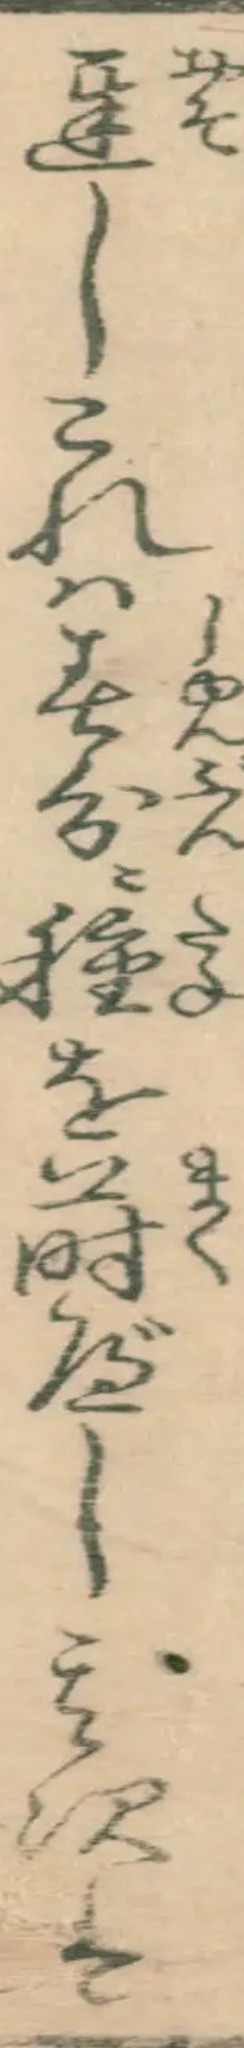遅しこれハ春分ニ種を蒔べし其次は
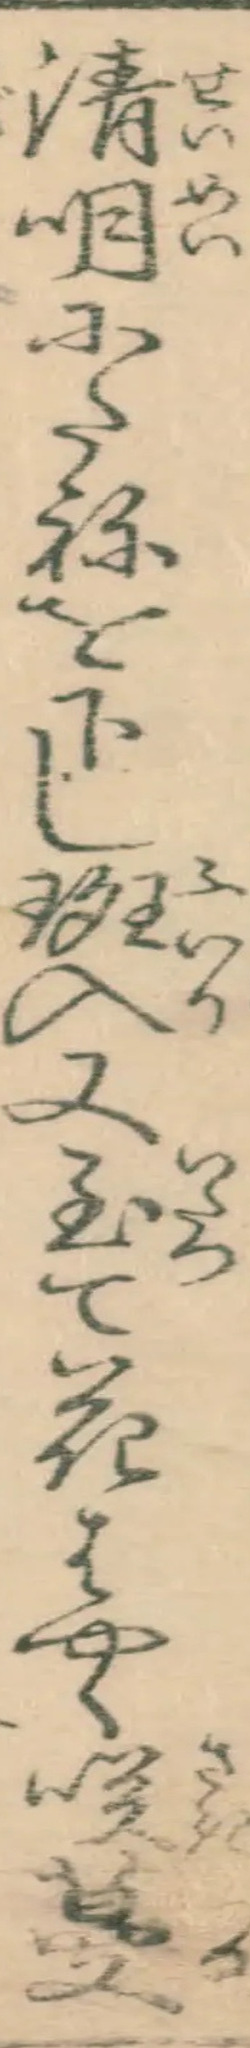清明にたねを下し斑入又至て花ははやく咲蔓
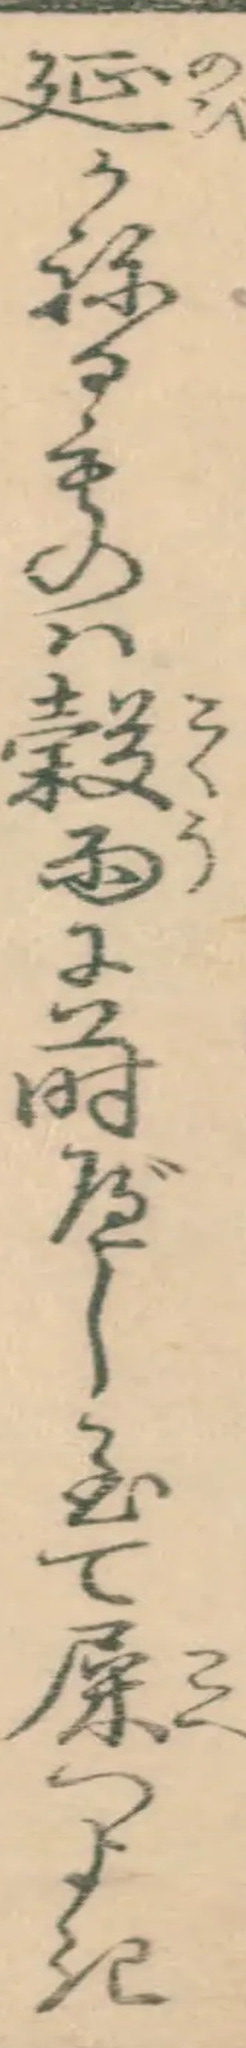延かねるものハ穀雨に蒔べし至て屎つよき
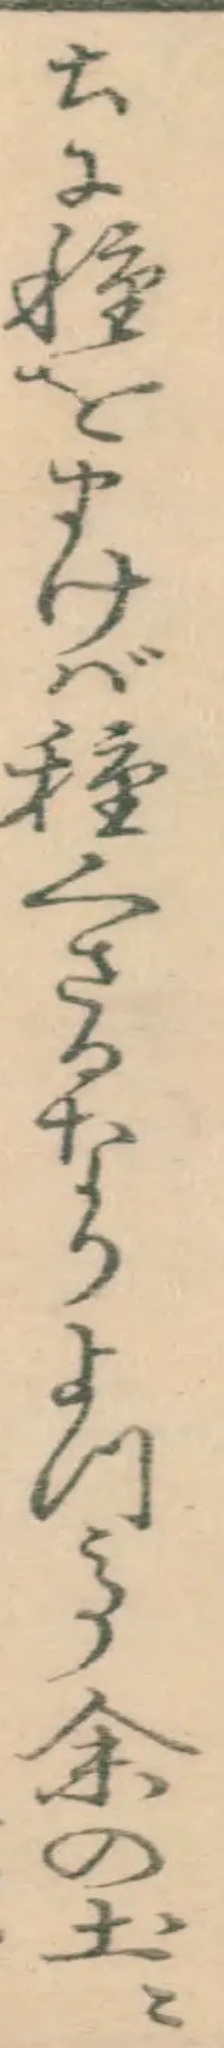土に種をまけバ種くさるなりよつて余の土ニ
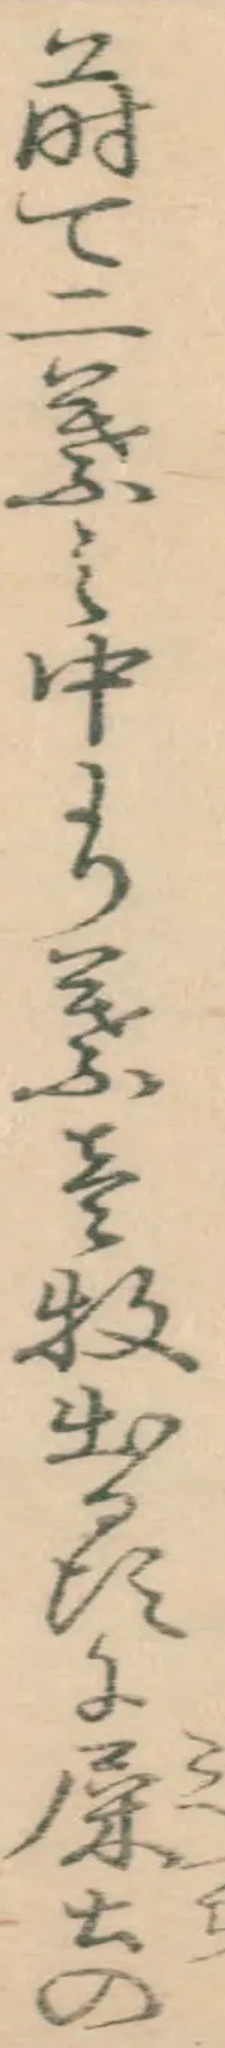蒔て二葉の中より葉壱枚出る頃に屎土の
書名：花壇朝顔通 2巻. [2]
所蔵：国立国会図書館 National Diet Library, JAPAN
